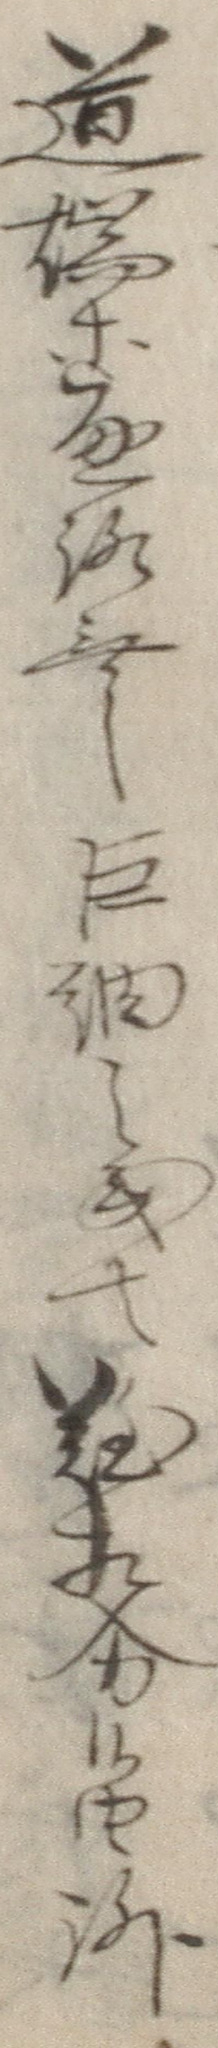道端等通路無之巨細之義は難相分候由訴
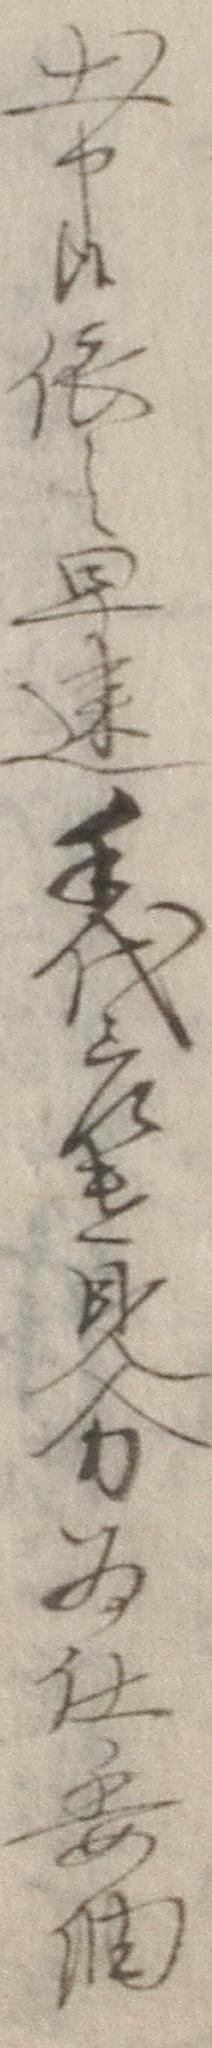出申候依之早速手代差遣見分為仕委細
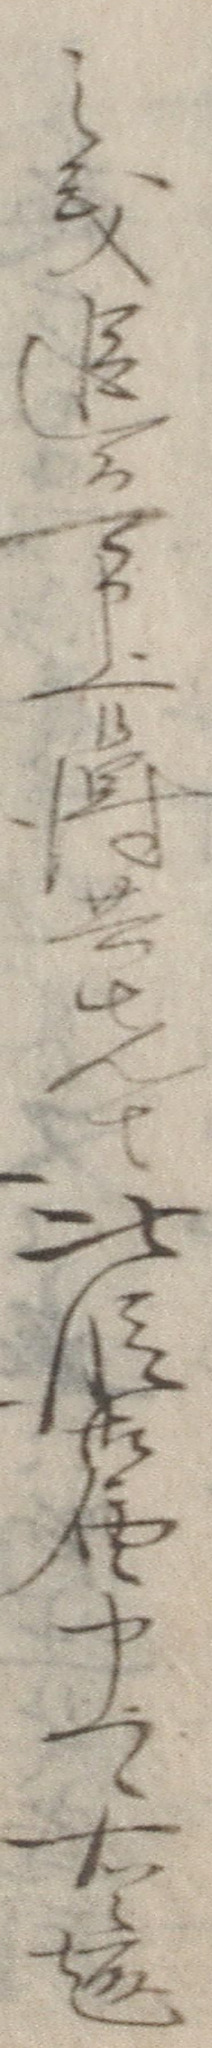之義追而可申上候得共先は此段御届申上候右之趣
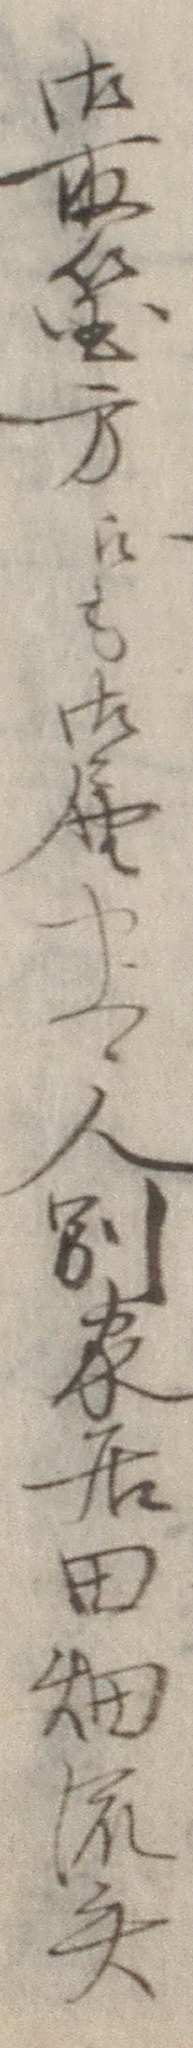御取箇方えも御届申上候人別家居田畑流失
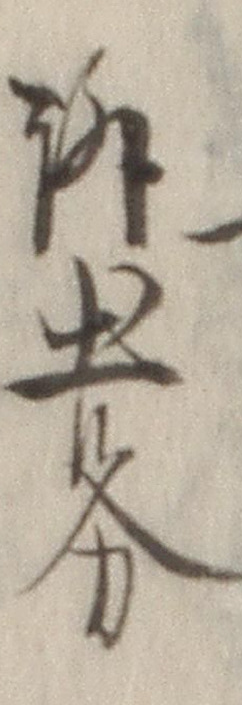訴出候分
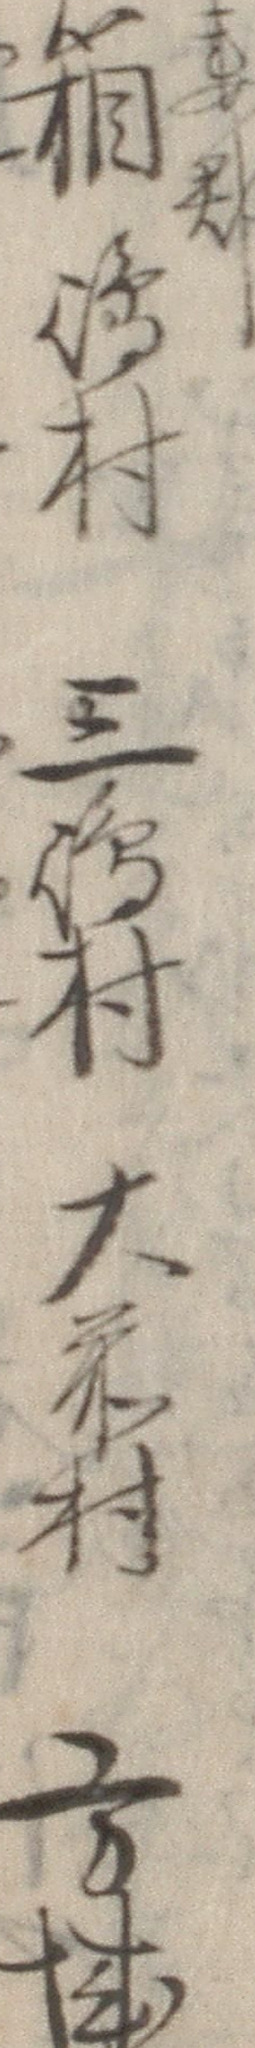箱嶋村三嶋村大前村方城村
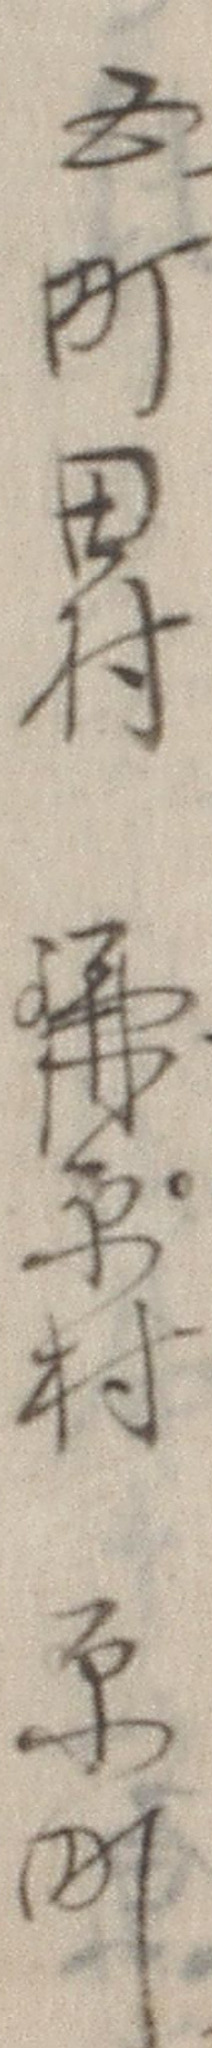五町田村鎌原村原町
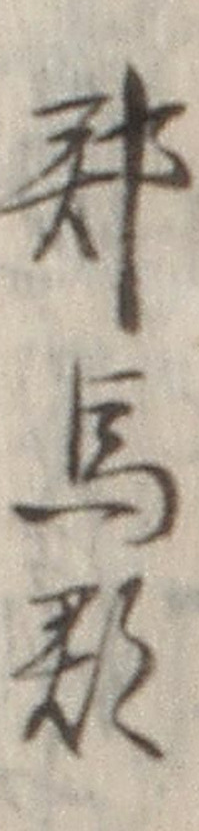群馬郡
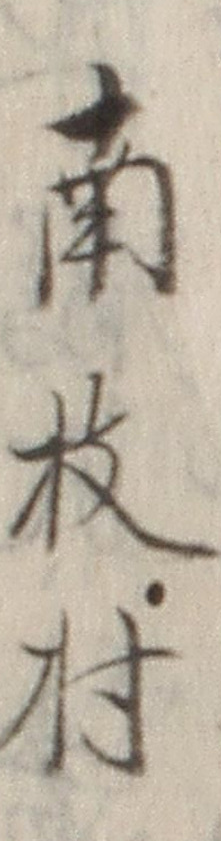南牧村
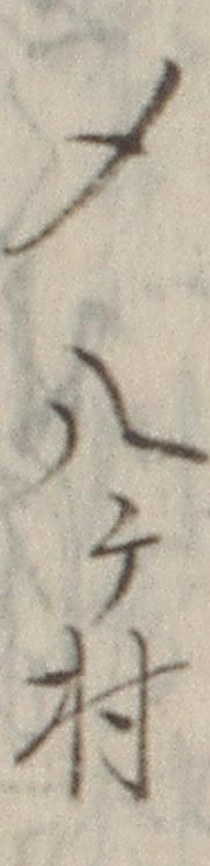〆八ケ村
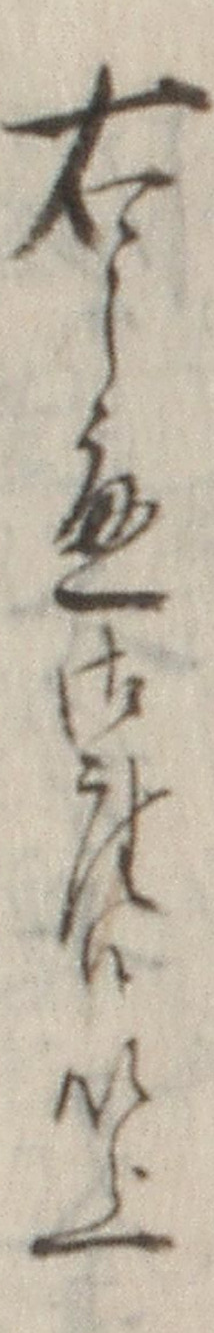右之通御座候以上
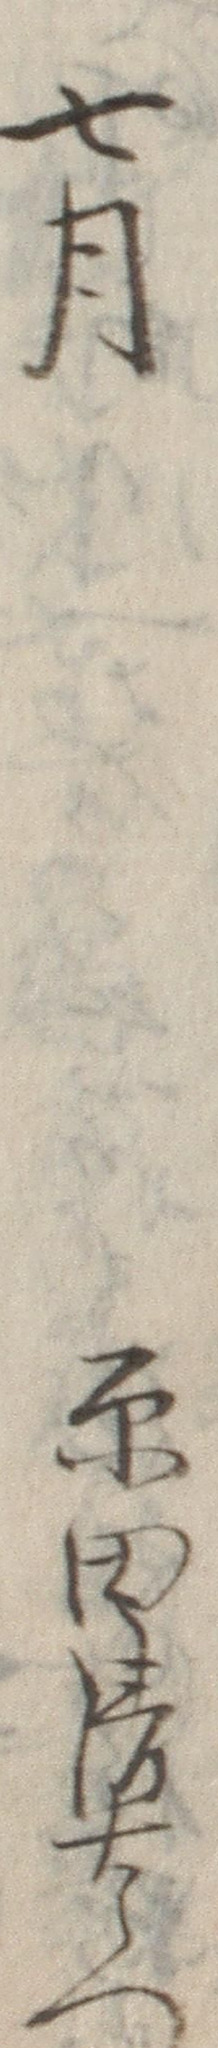七月原田清右衛門
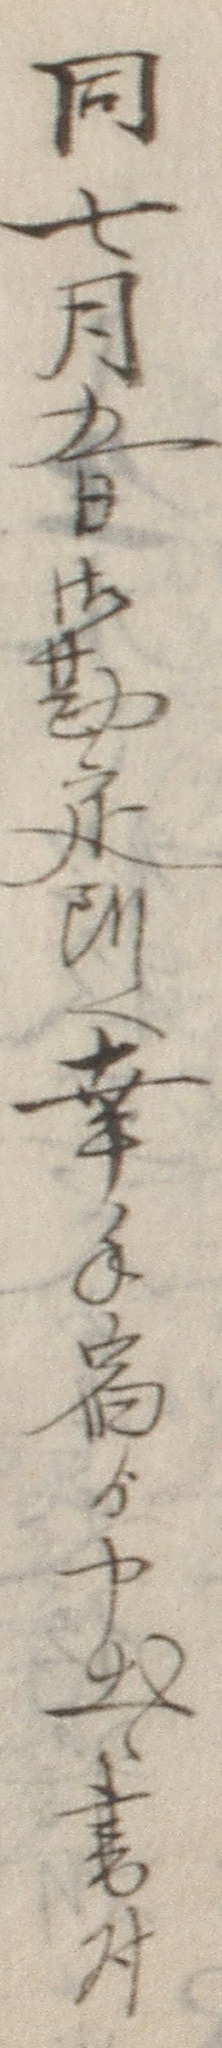同七月五日御勘定所へ幸手宿ゟ申出候書付
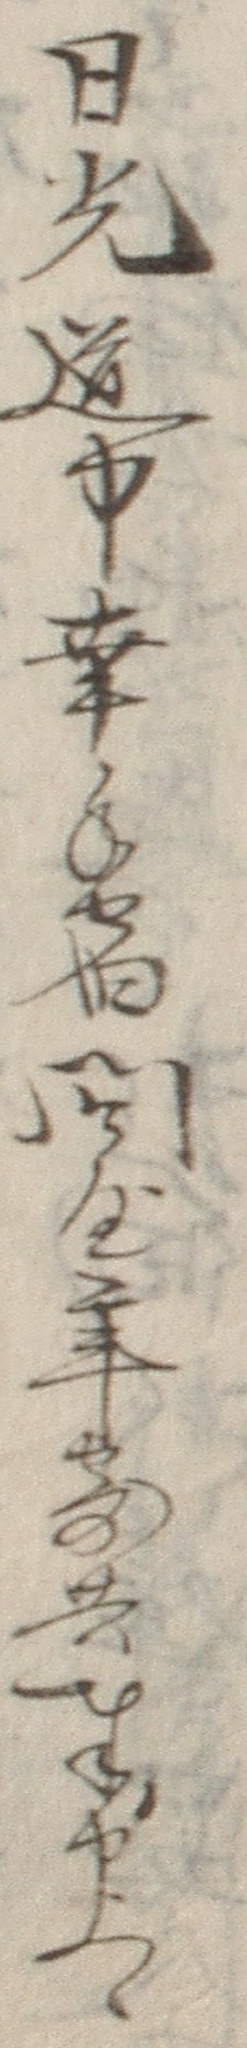日光道中幸手宿問屋年寄共奉申上候
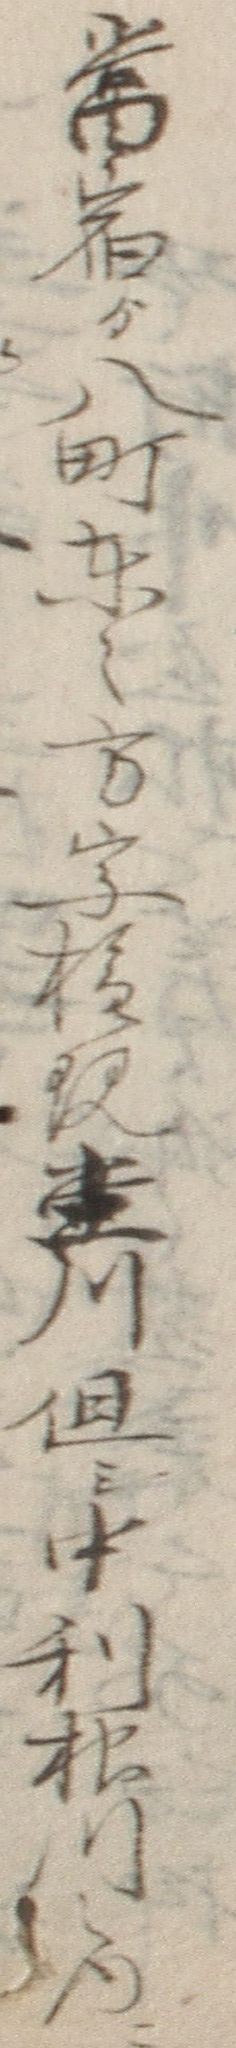常宿ゟ八町東之方字権現堂川但シ中利根川之内ニ
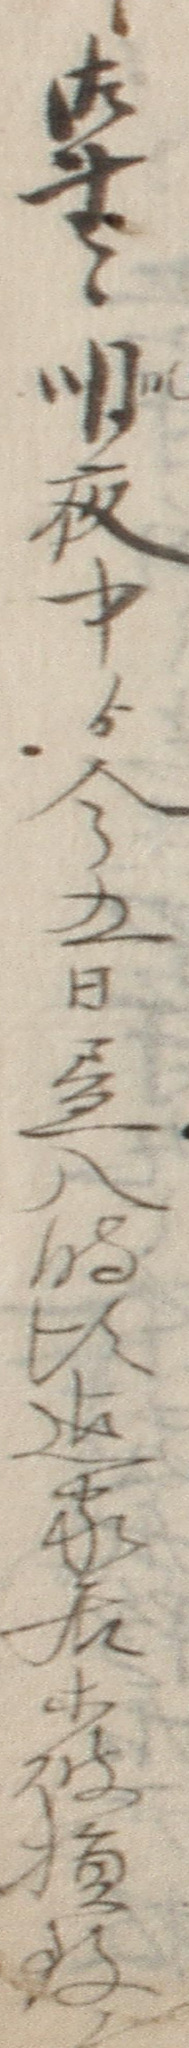御座候明夜中ゟ今五日昼八時比迄家居等破損致
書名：[諸国災害記録]
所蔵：東京大学地震研究所図書室 Earthquake Research Institute Library, The University of Tokyo, JAPAN
